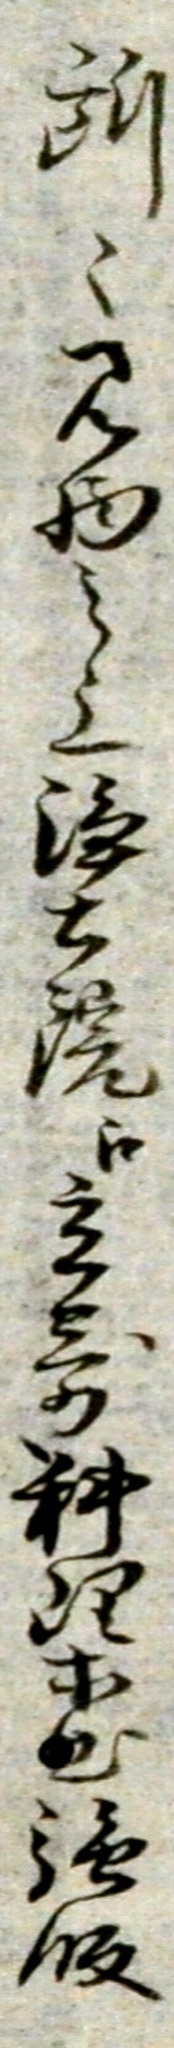所々見物之上浄土院江立寄料理等出強飯
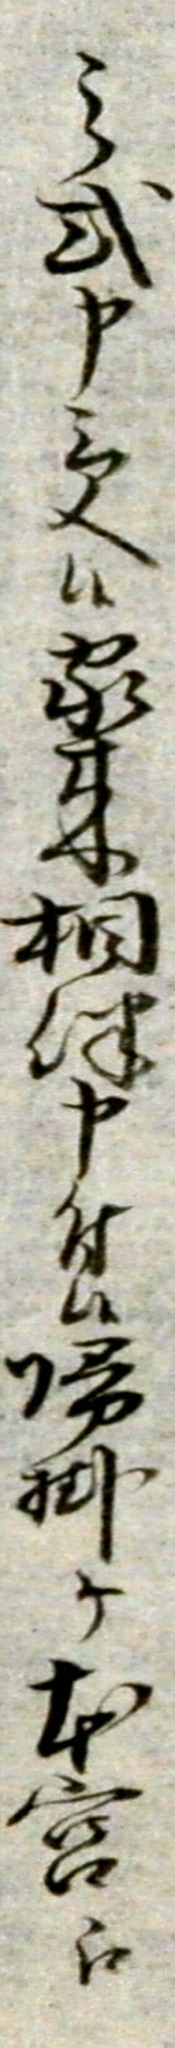之式申受候家来相伴申付候帰掛ヶ本宮江
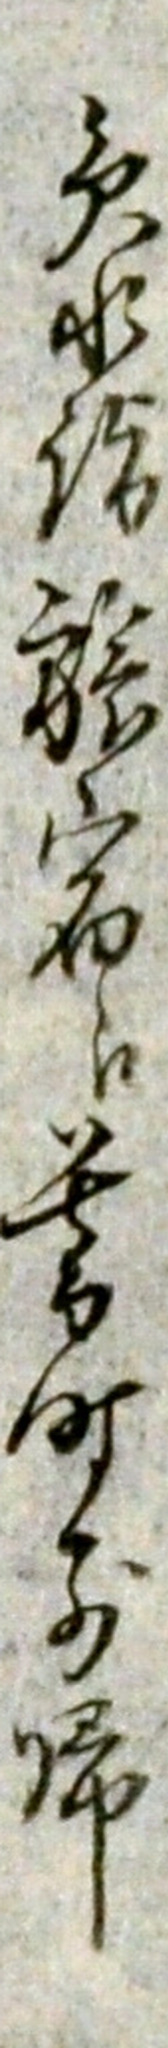参詣旅宿江暮時前帰

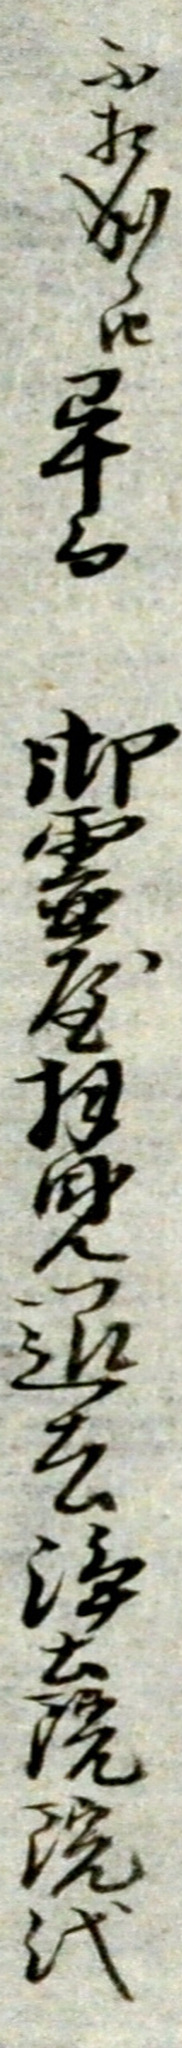不相成候由畢而御霊屋拝見退去浄土院代
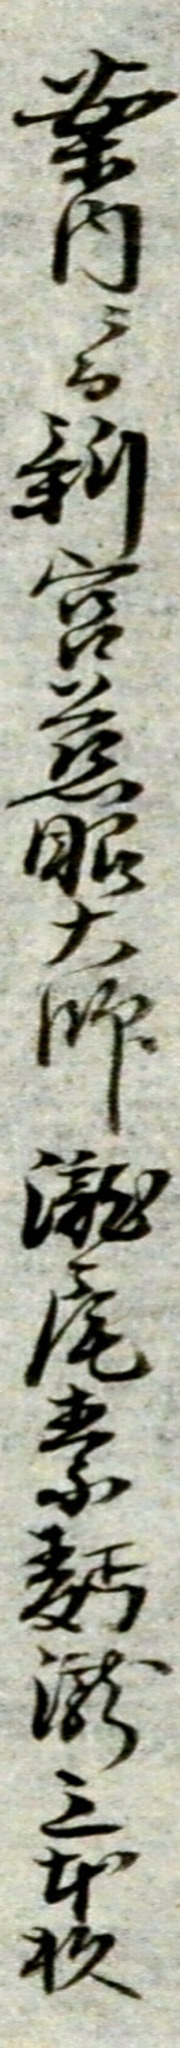案内ニ而新宮慈眼大師瀧尾素麪瀧三本杉
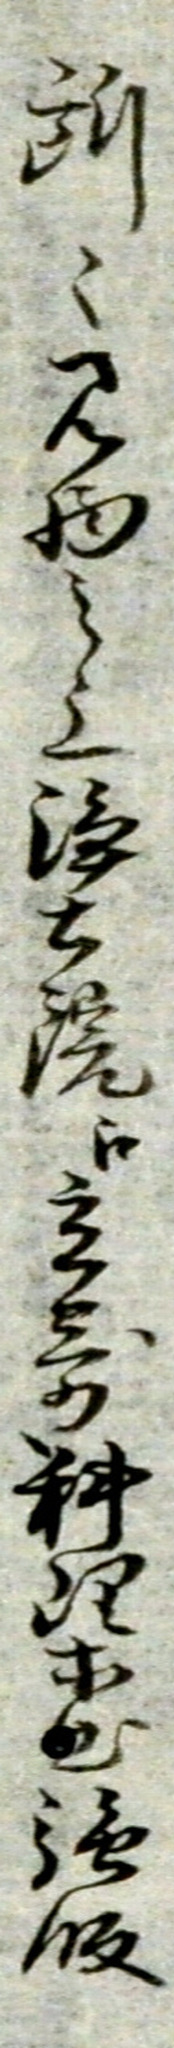所々見物之上浄土院江立寄料理等出強飯
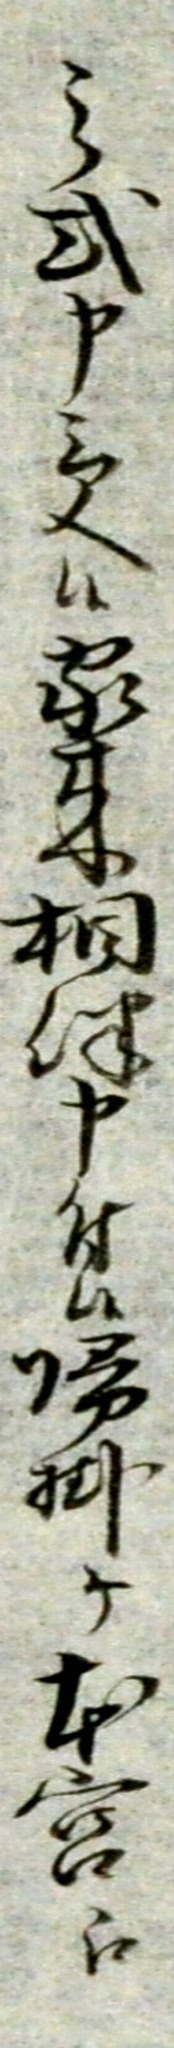之式申受候家来相伴申付候帰掛ケ本宮江
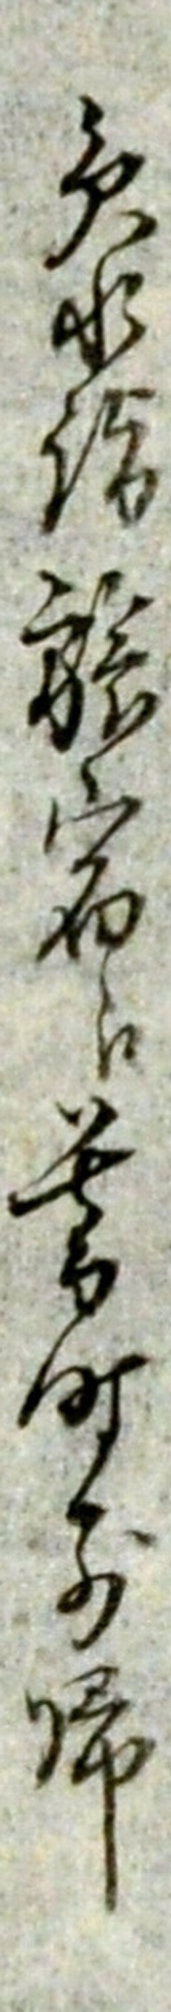貞水詣旅宿江暮時前帰
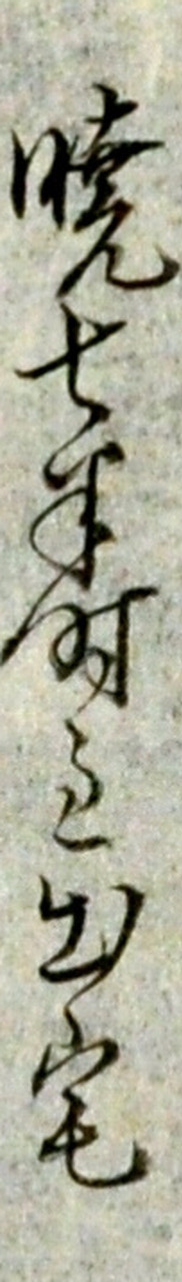暁七半時過出宅
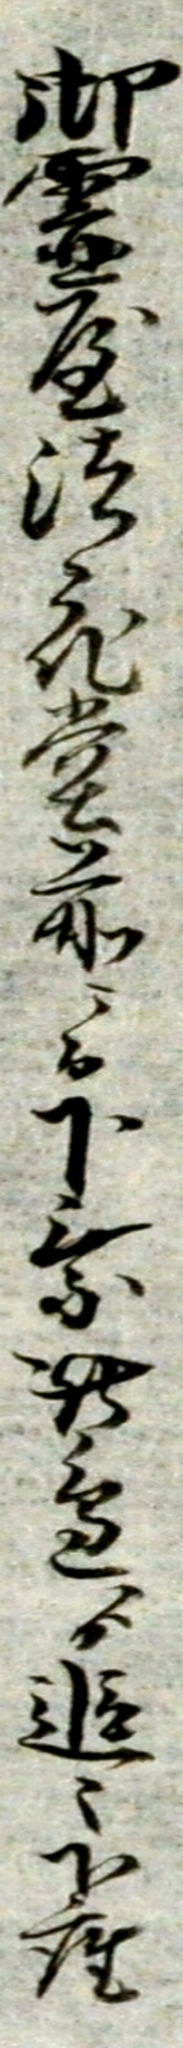御霊屋法花堂前ニ而下乗此辺ゟ追々下座
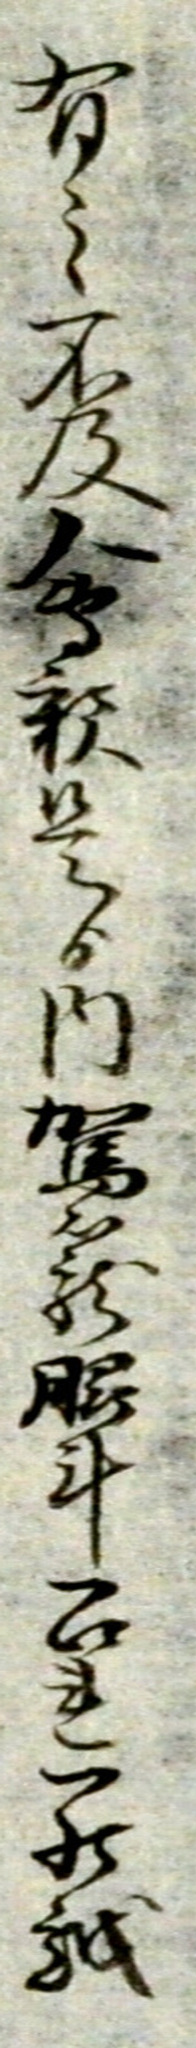有之不及会釈是ゟ内駕籠脇計召連罷越
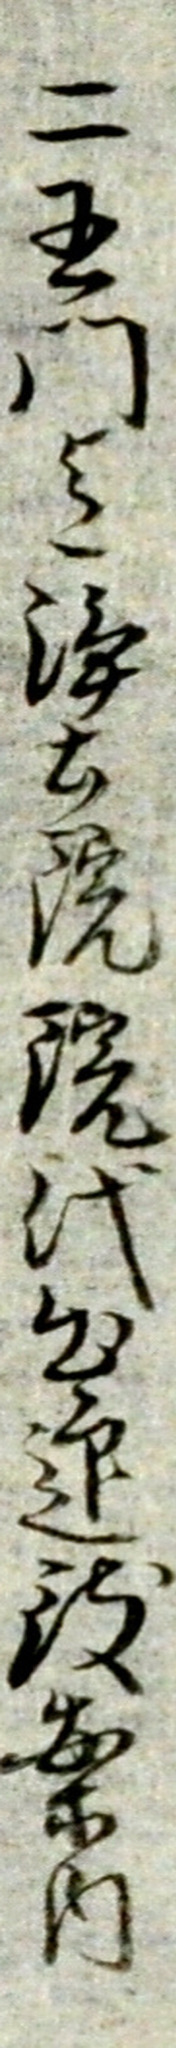二王門迄浄土院院代出迎致案内
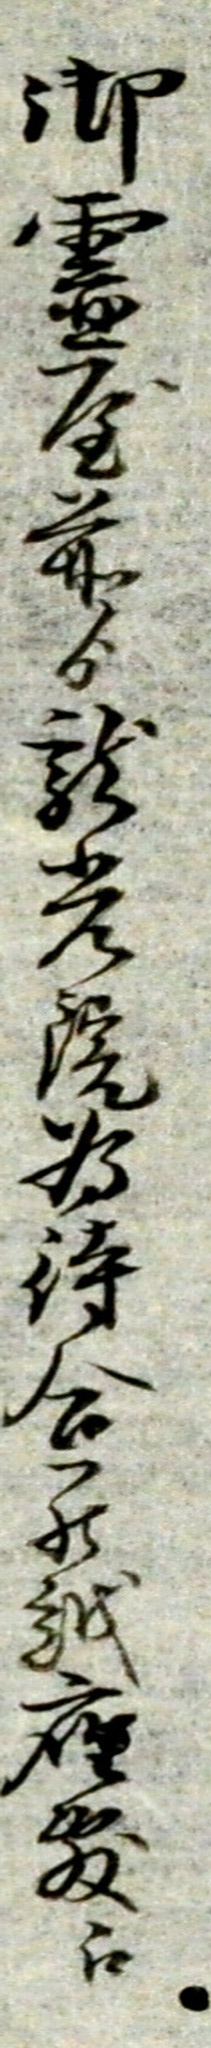御霊屋前ゟ龍光院為待合罷越座敷江
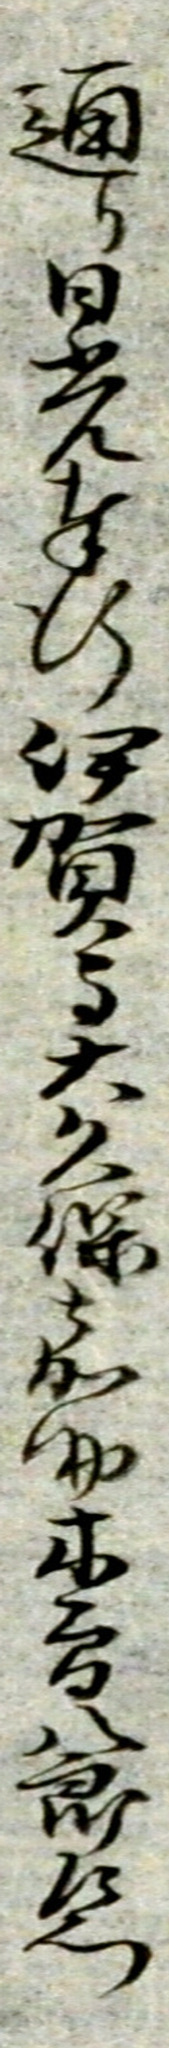通り日光奉行伊賀守大久保嘉助木曽八郎左衛門
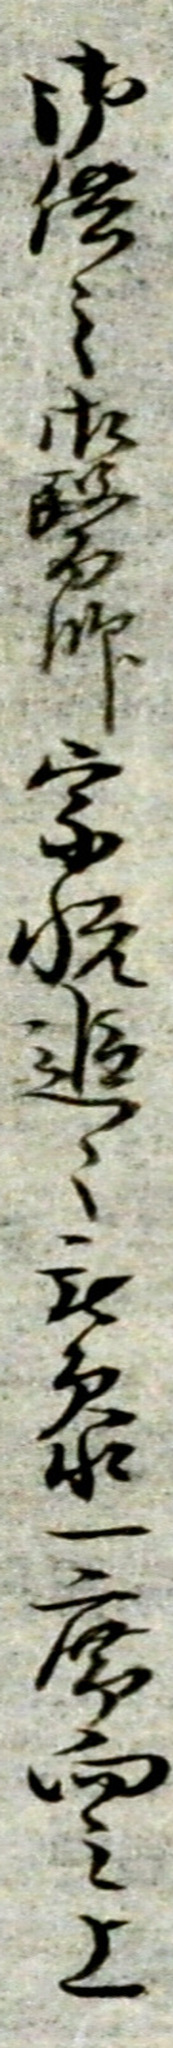御供之御医師宗悦追々被参一席向之上
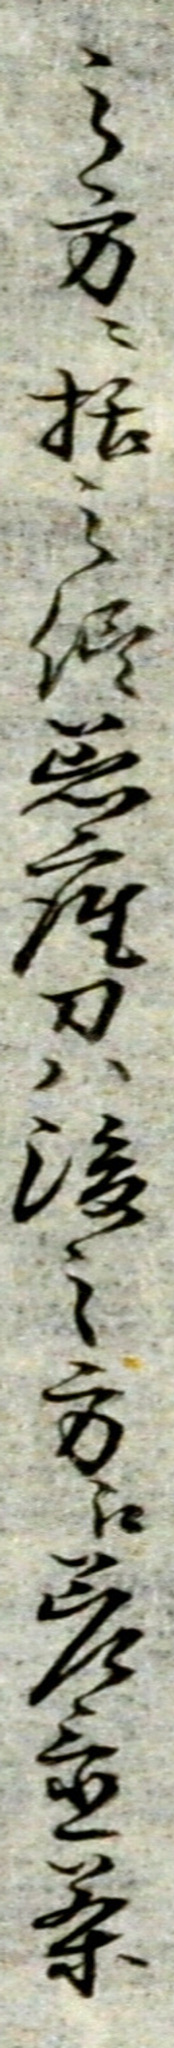之方ニ括之侭着座刀ハ渡之方江差置茶
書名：日光御名代相勤候節ノ留
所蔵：伊那市立高遠町図書館・合同会社AMANE
